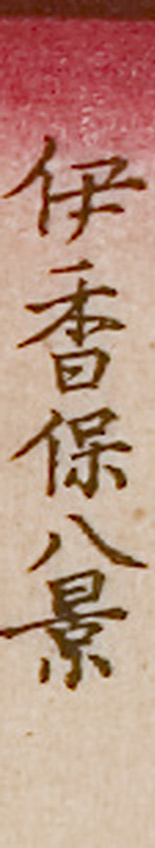伊香保八景
